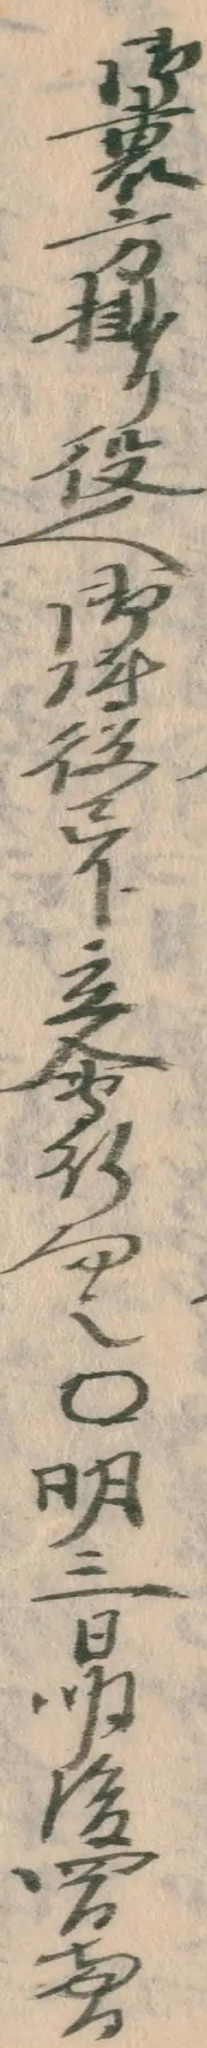御裏方掛り役人御附役已下立會行向也○明三日明後四日両日
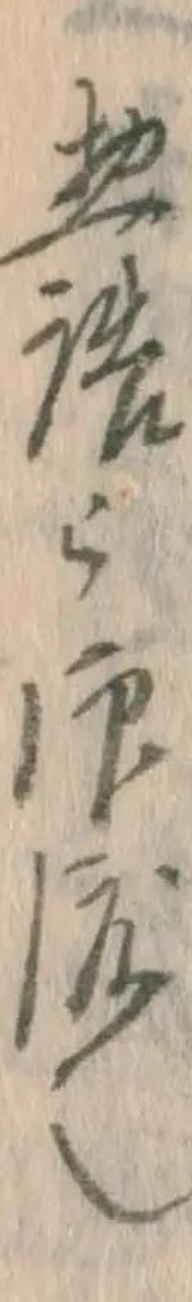惣詰被仰渡也
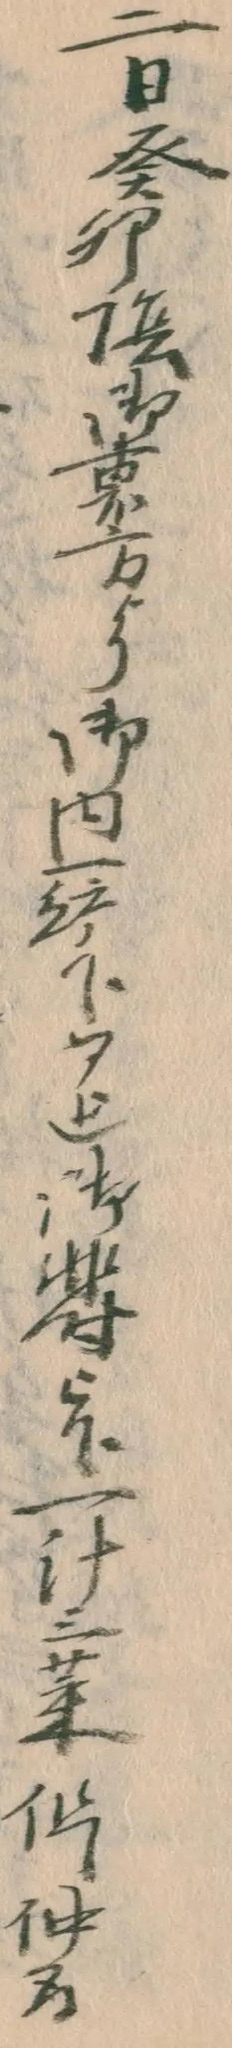三日癸卯陰御裏方より御内一統下御廻御非時已下一汁三菜但し仲間
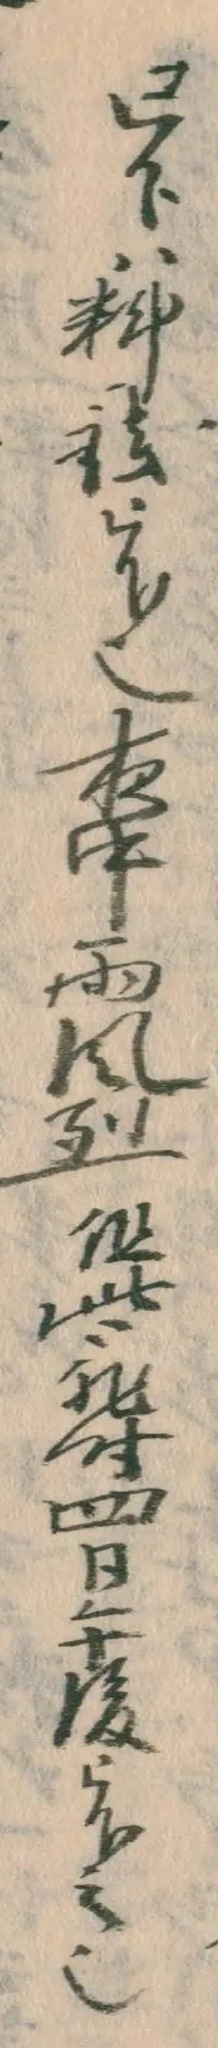已下ハ両銭被下也夜中雨風烈但此御時四日午後被下之也
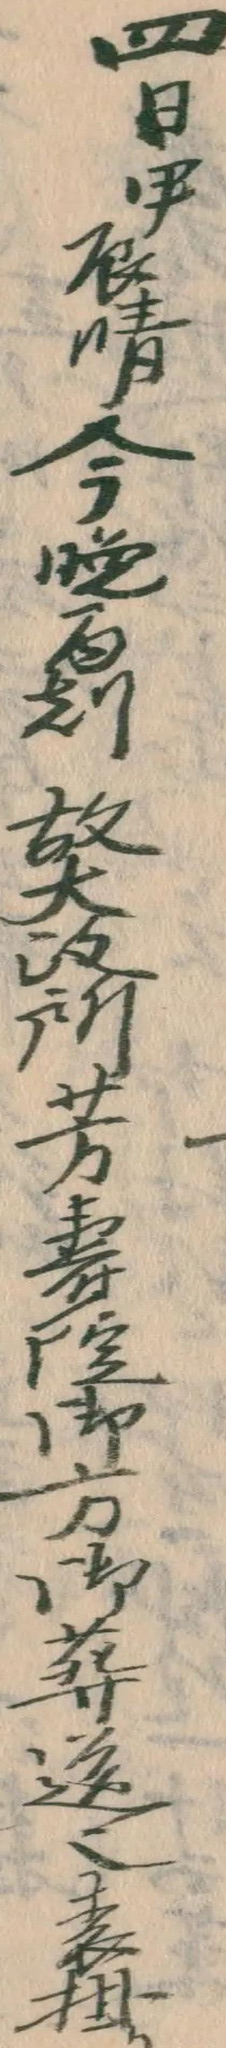四日甲辰晴今晩酉刻故大政所芳壽院御方御葬送之表掛り
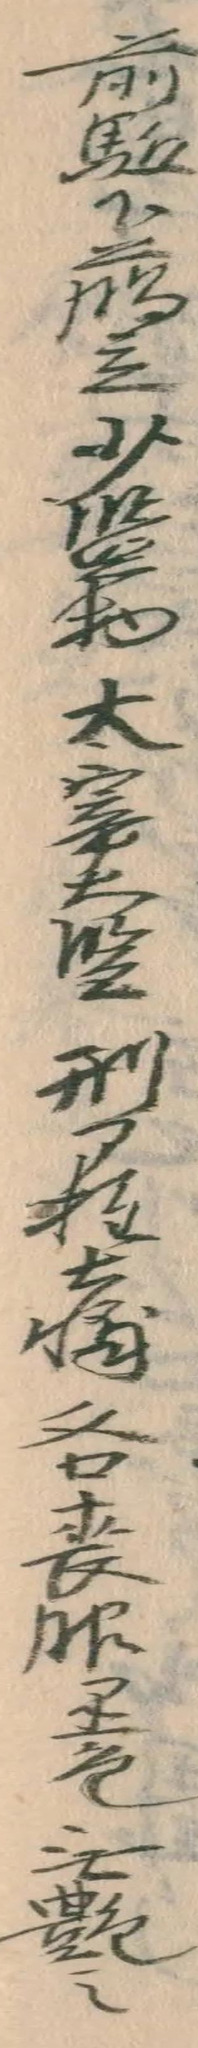前駈下臈之少監物太宰大監刑部権大輔各喪服黒色無艶之
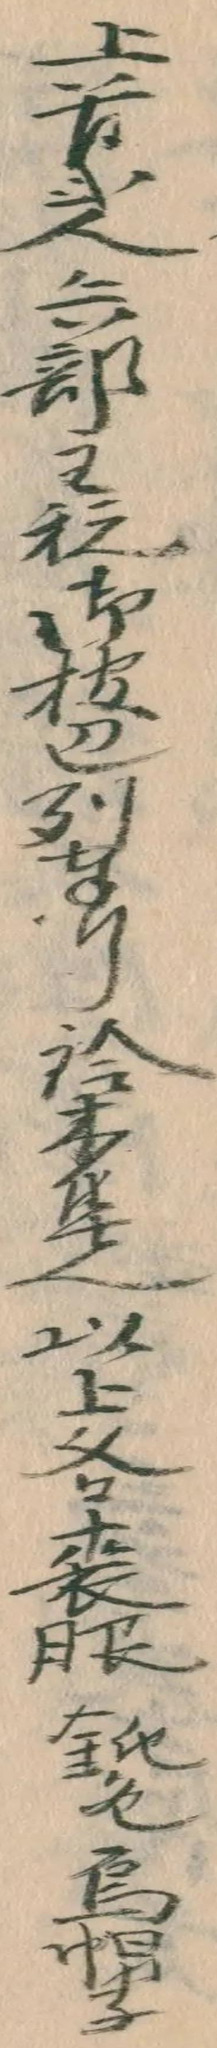上首弐人兵部王祝御棺辺列奉行鈴木隼人以上各喪服鈍毛烏帽子
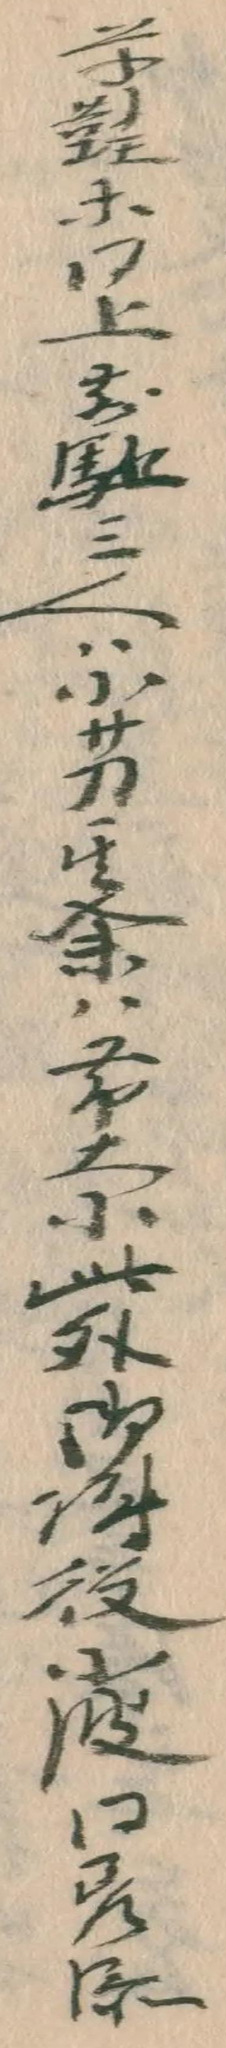前鞋等同上前駈三人ハ小サ刀其余は帯大小此外御附役小波同差添
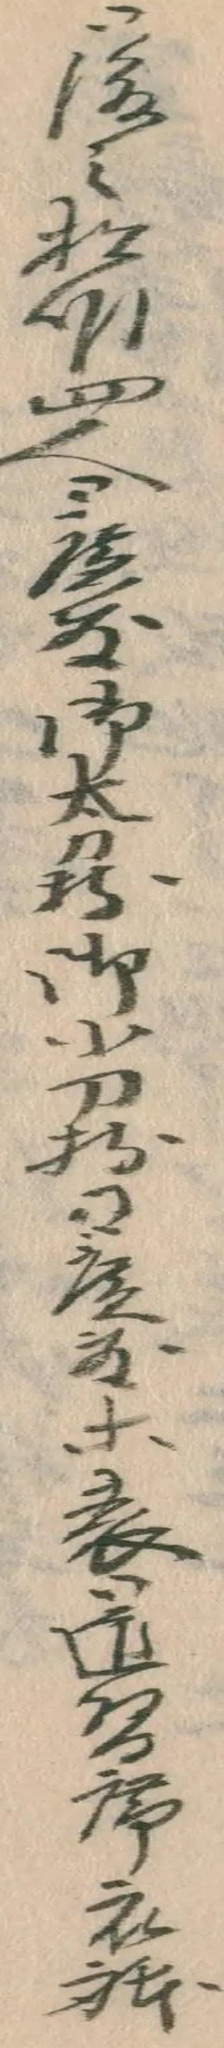御後之松明四人御廣敷御大刀持御小刀持御屋敷等表御近習席衣躰
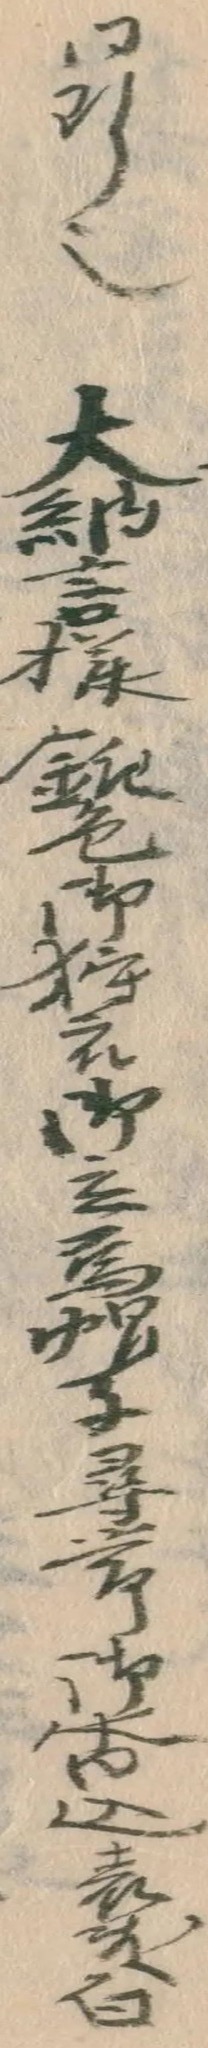同断也大納言様鈍色御狩衣御立烏帽子尋常御沓込表敷白
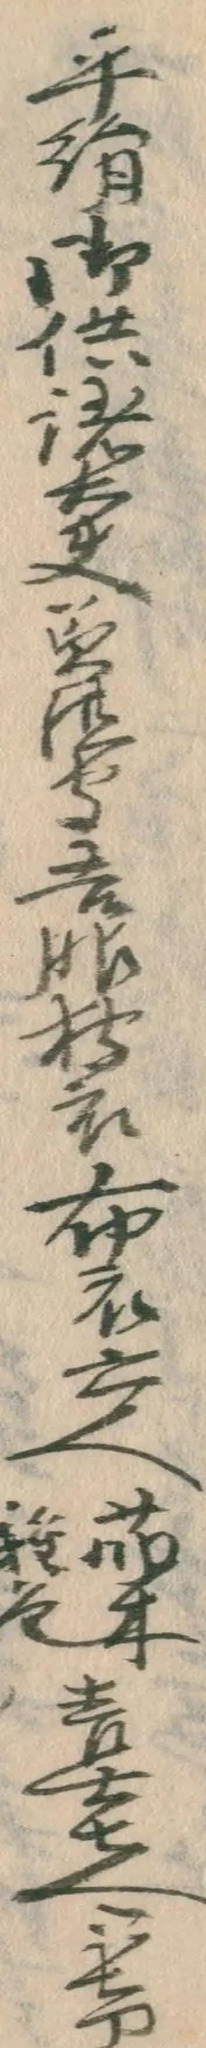平絹御供諸大夫美濃守吉眼狩衣布衣六人萌木雑色青士七人無刀
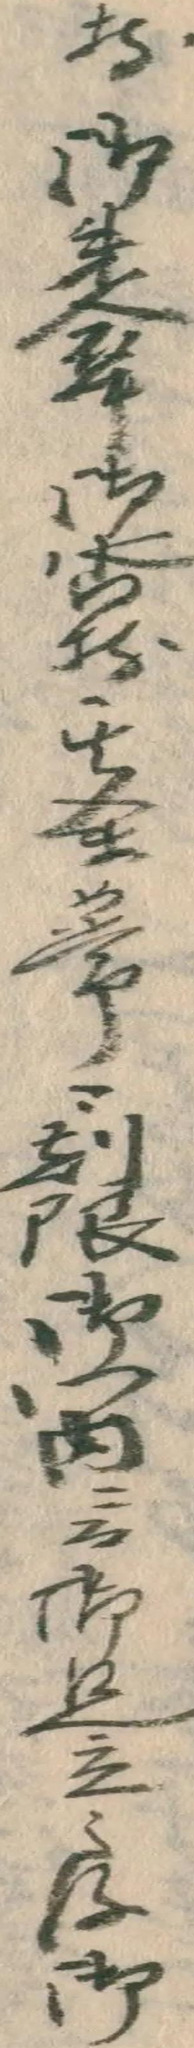持御朱傘御沓持其余如常御刻限御門内ニ而御見立之後御
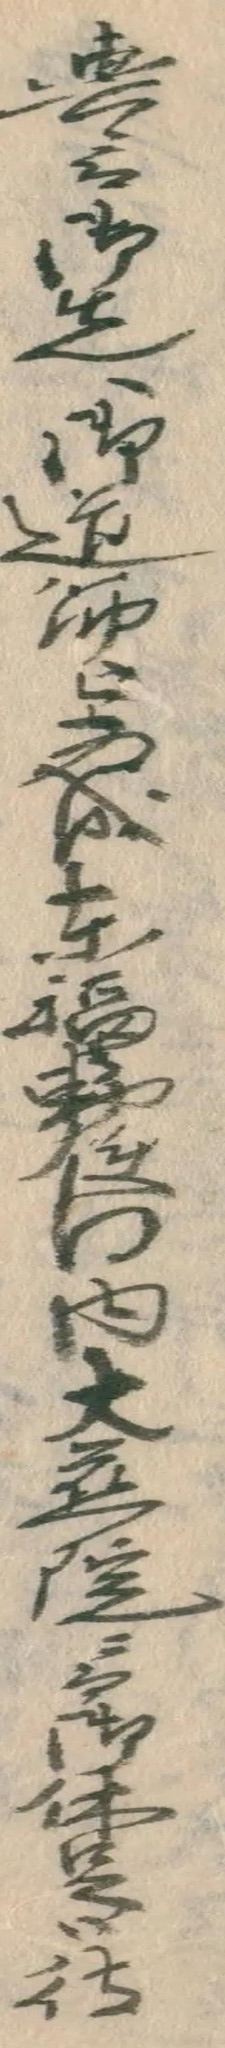輿ニ而御先へ御道筋被敷成東福勅使門内大慈院ニ而御休足御待
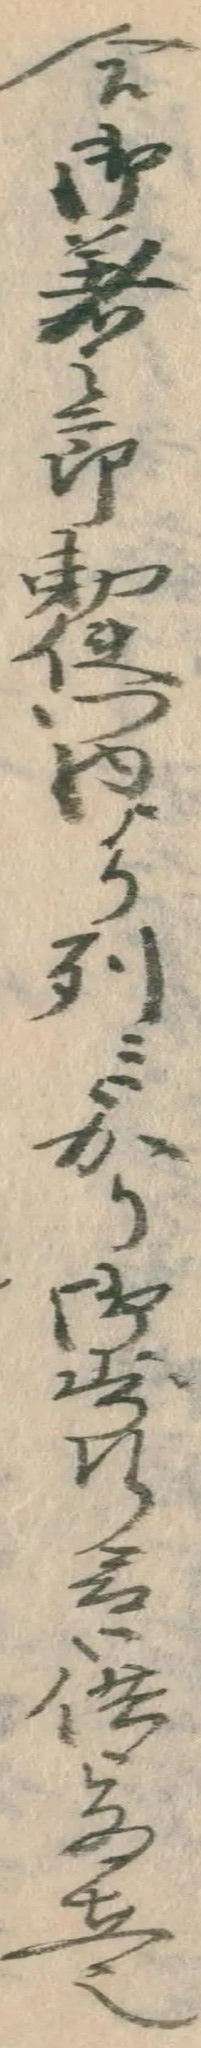合御着之節勅使門内より列ニ被加り御歩行ニ而ハ供被為在也
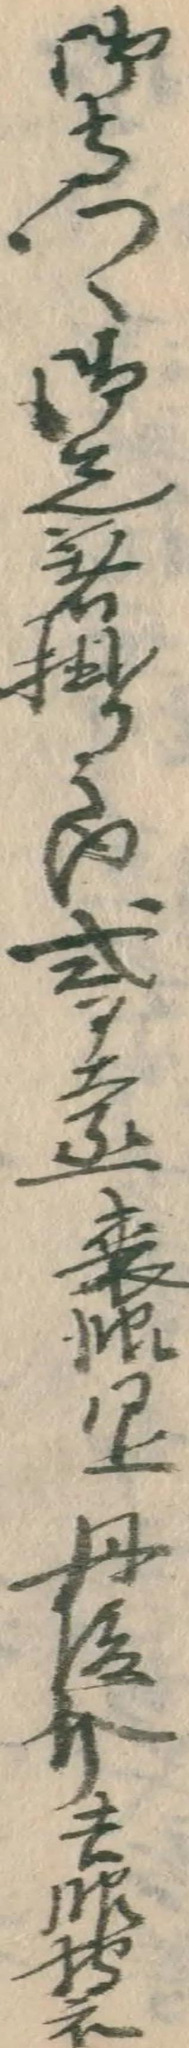御寺門へ御先者掛り之内式部大丞喪服同上丹後介吉眼狩衣
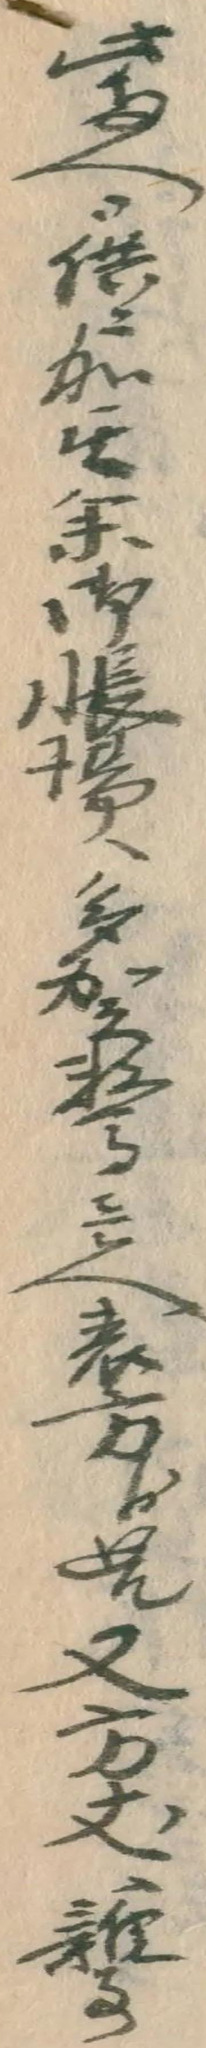此両人御供ニ加其余御帳場へ多賀警壱人表方ゟ是又方丈雑事
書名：賀茂社記録. 第69冊
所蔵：国立国会図書館 National Diet Library, JAPAN
